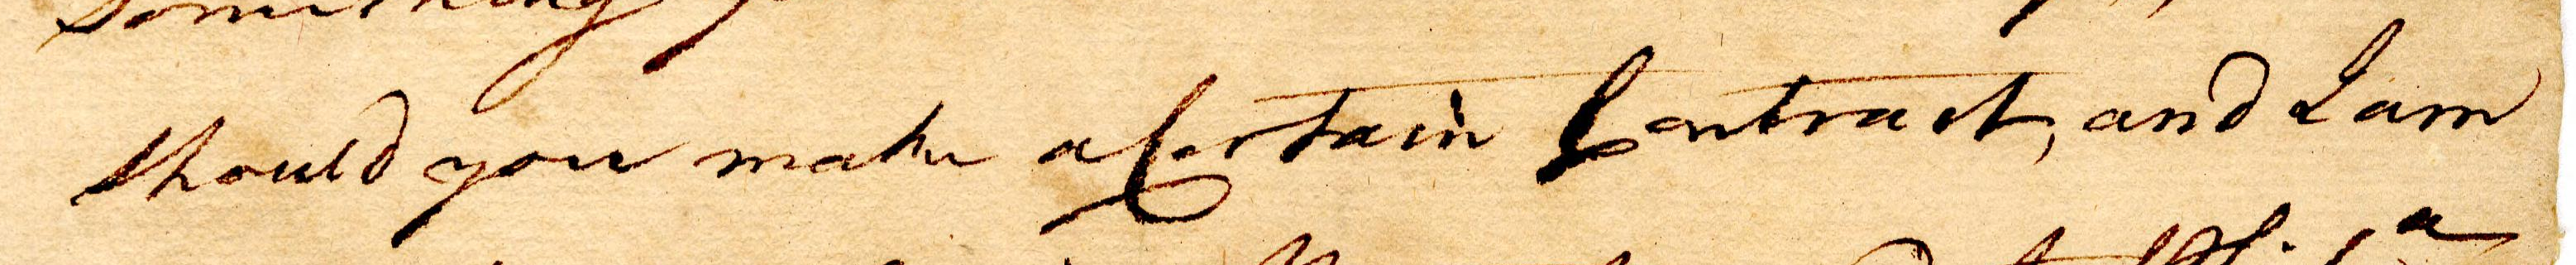should you make a Certain contract, and I am
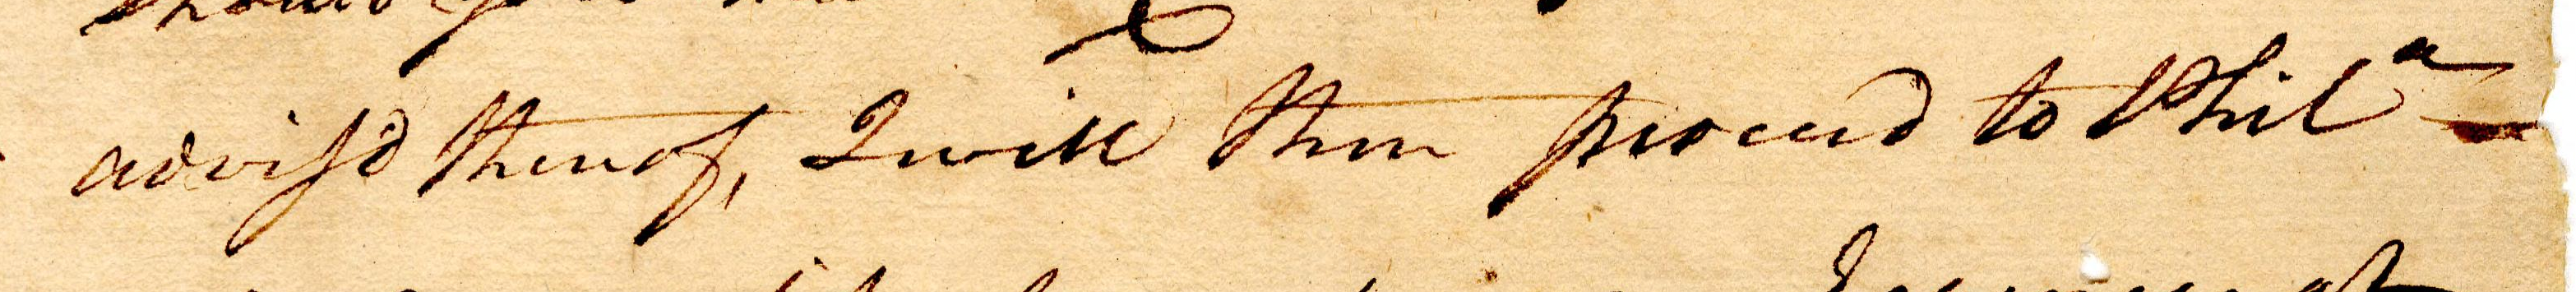advis'd therof, I will then proceed to Phil^a
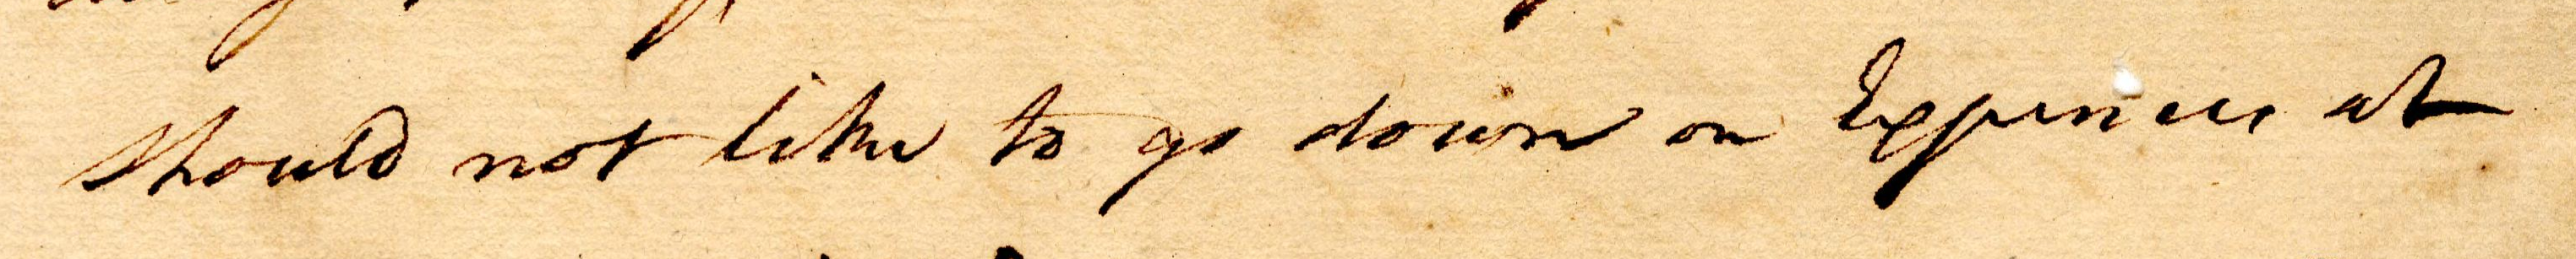should not like to go down on Expences at
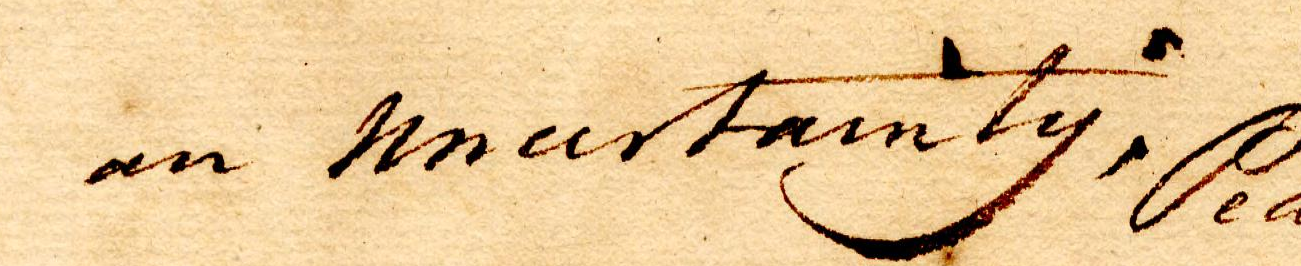an uncertainty
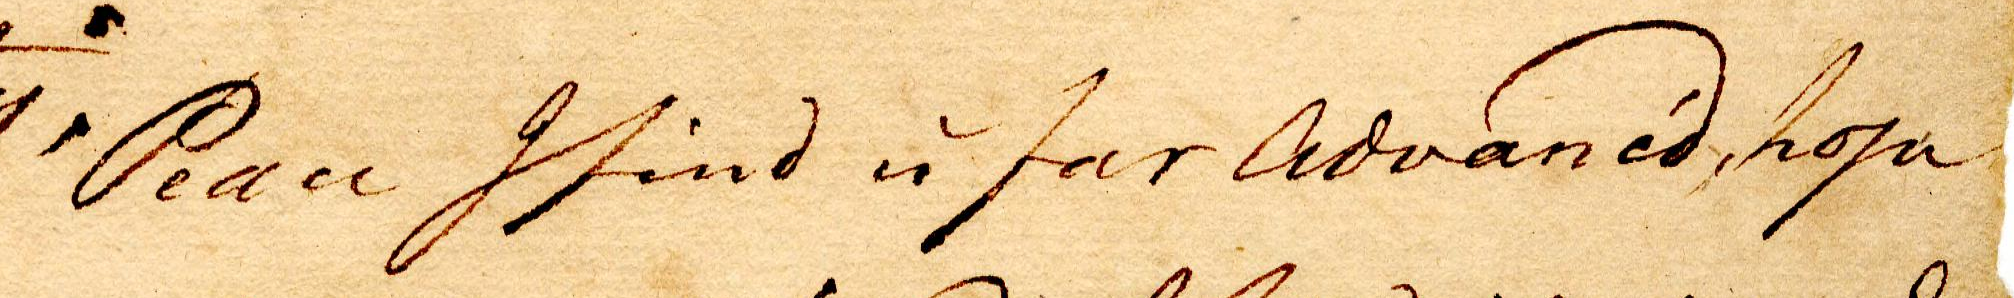Peace I find is far advanc'd, hope
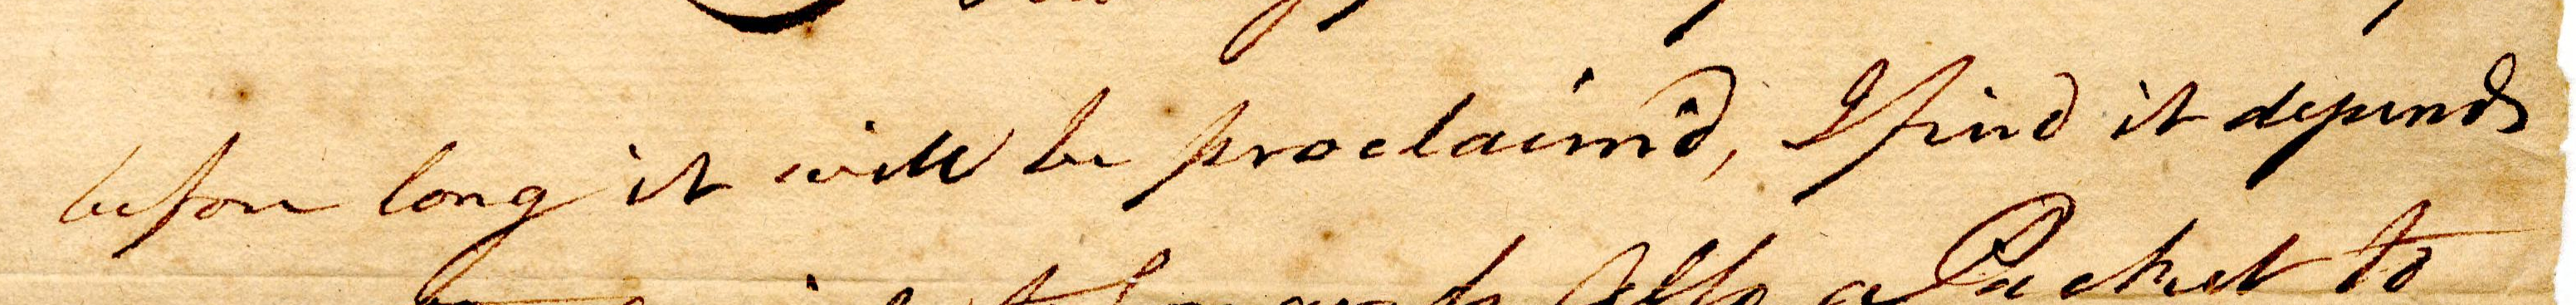before long it will be proclaim'd, I find it depends
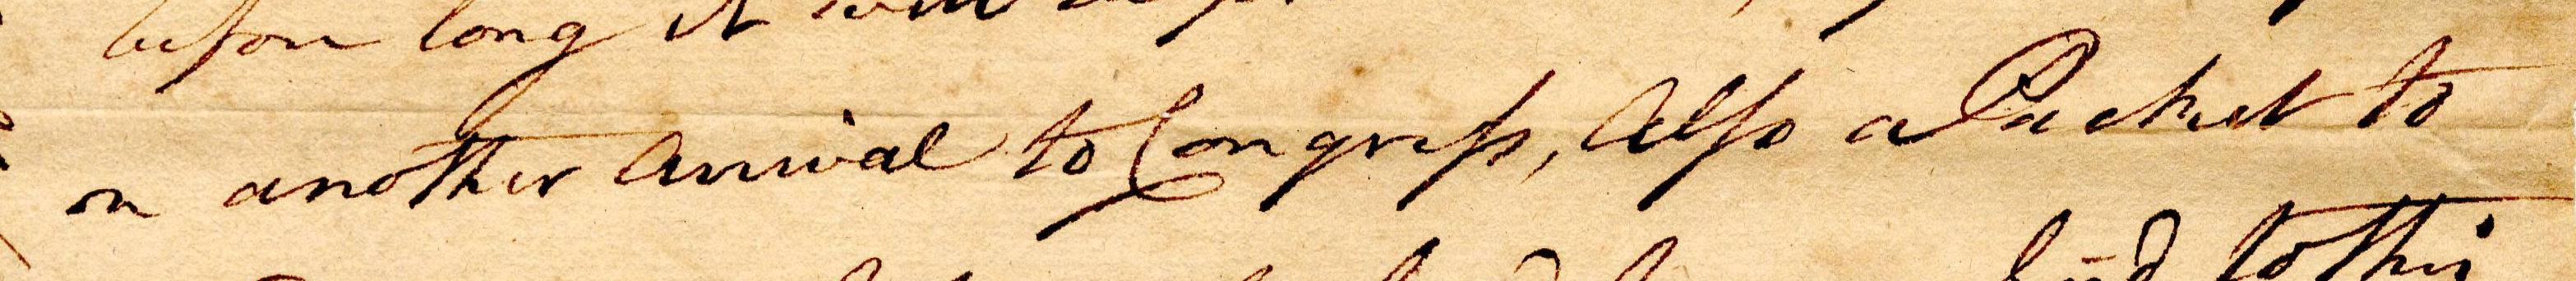on another Arrival to Congress, Also a Packet to
